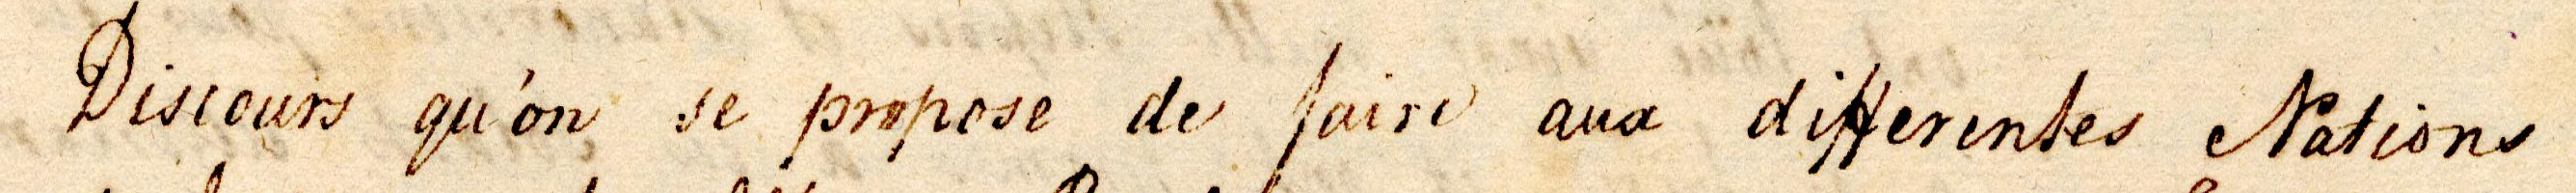Discours qu'on se propose de faire aux differentes Nations
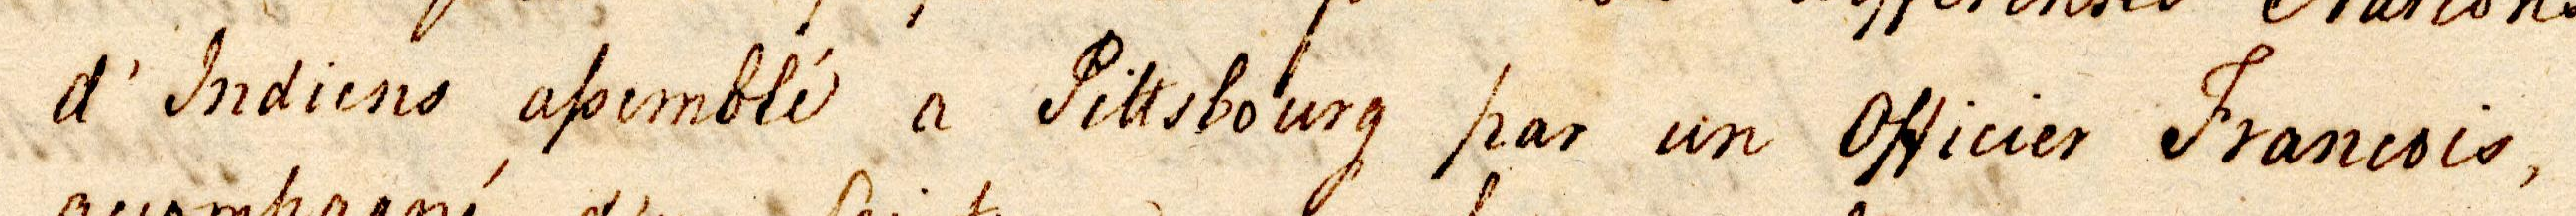d'Indiens assemblé a Pittsbourg par un Officier Francois,
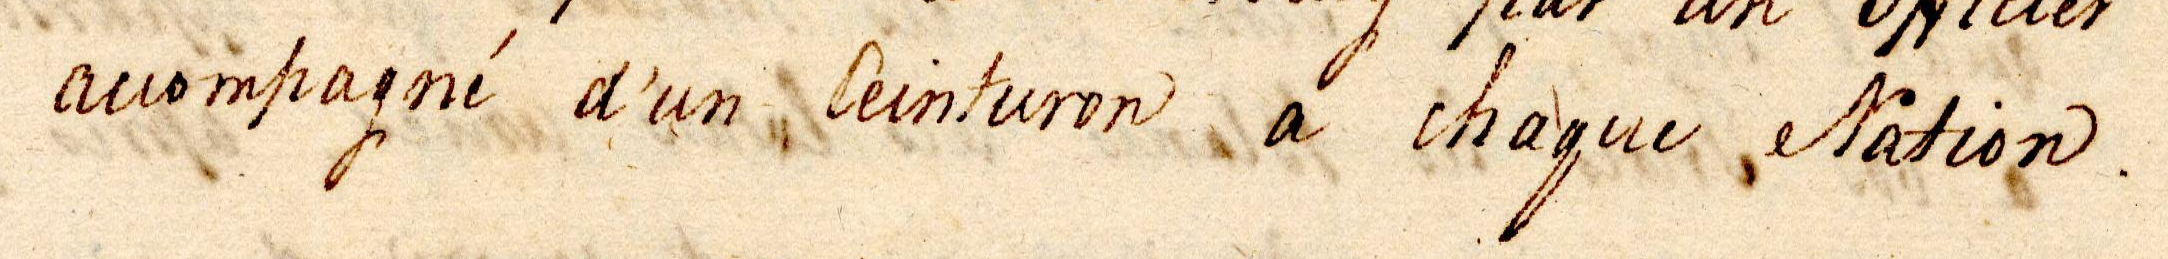accompagné d'un Ceinturon a chaque Nation.
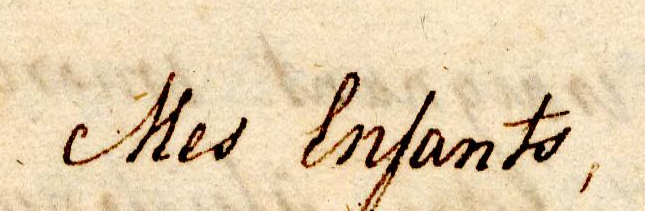Mes Enfants
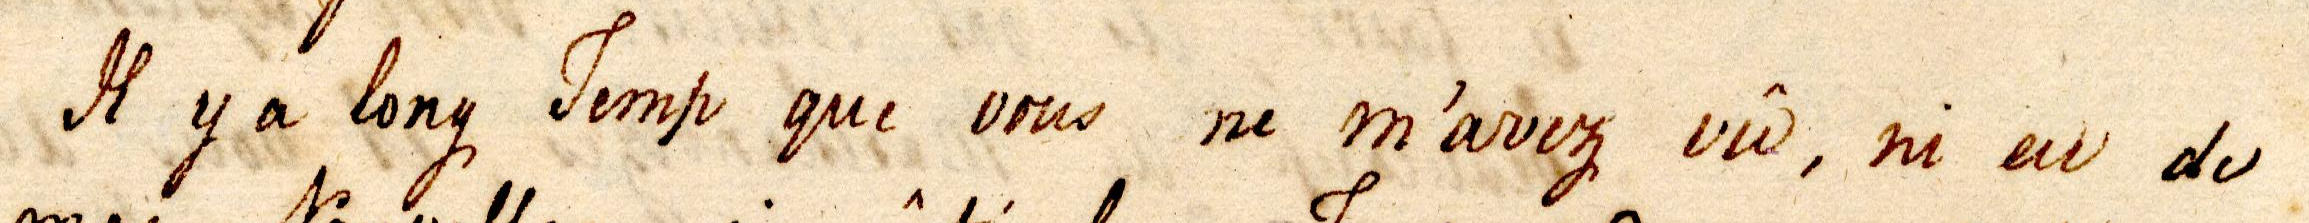Il y a long Temp que vous ne m'avez vû, ni eu du
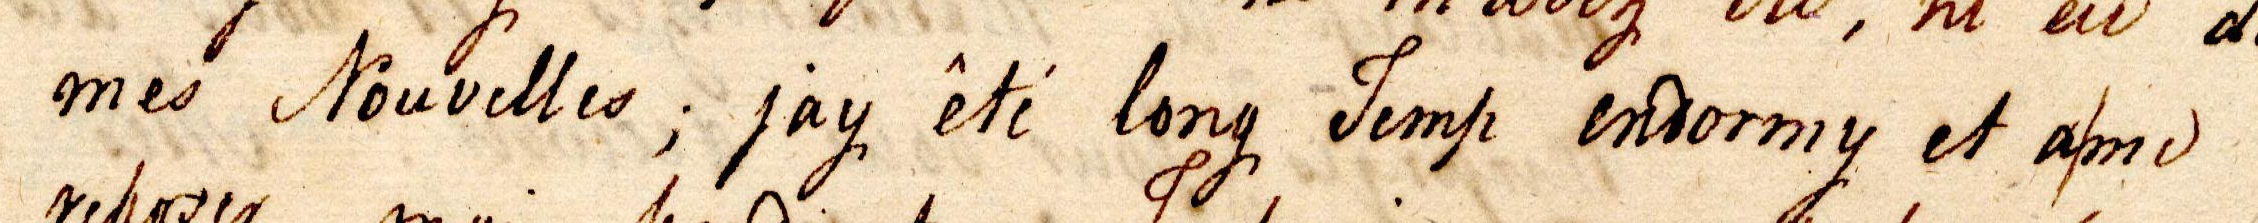mes Nouvelles; jay êté long Temp endormy et ame
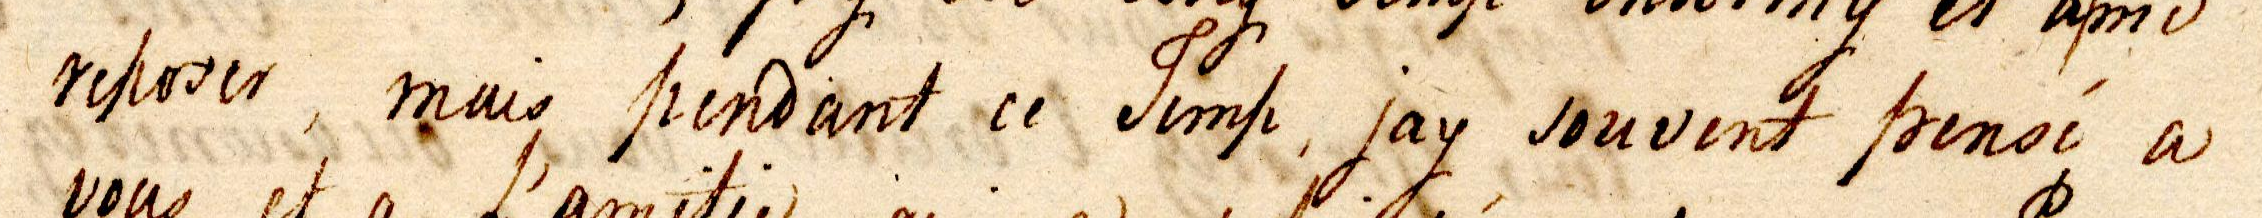reposer, mais pendant ce Temp, jay souvent pensé a
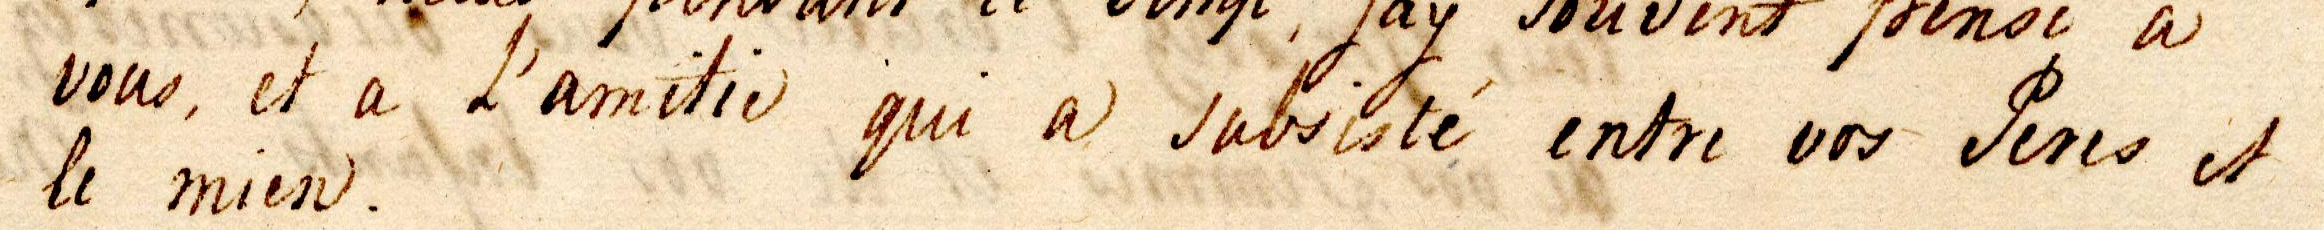vous, et a L'amitie qui a subsisté entre vos Peres et
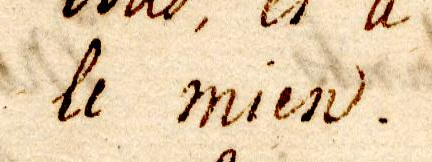le mien.
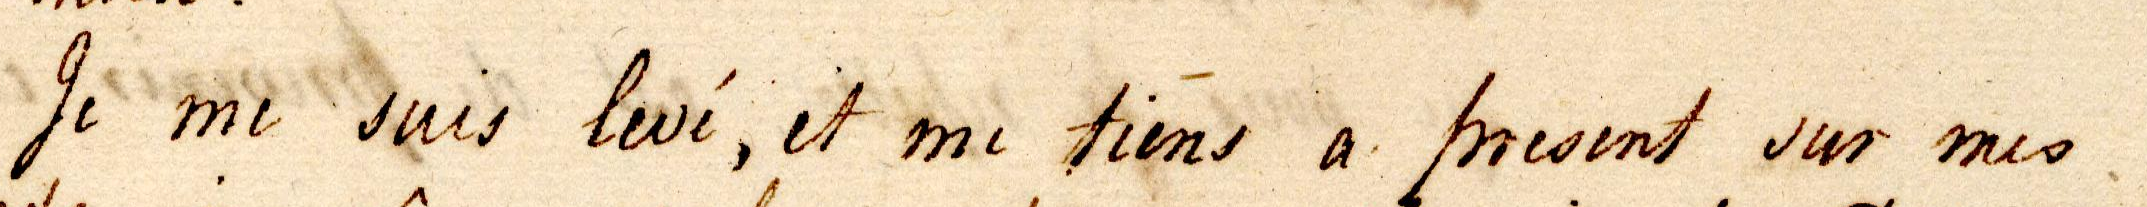Je me suis levé, et me tiens a present sur mes
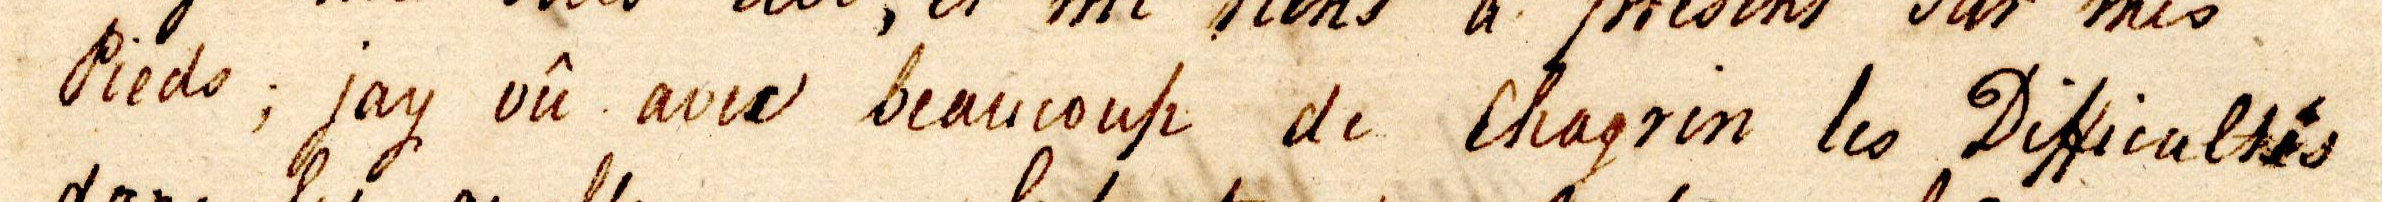Pieds; jay vû avec beaucoup de Chagrin les Difficultés
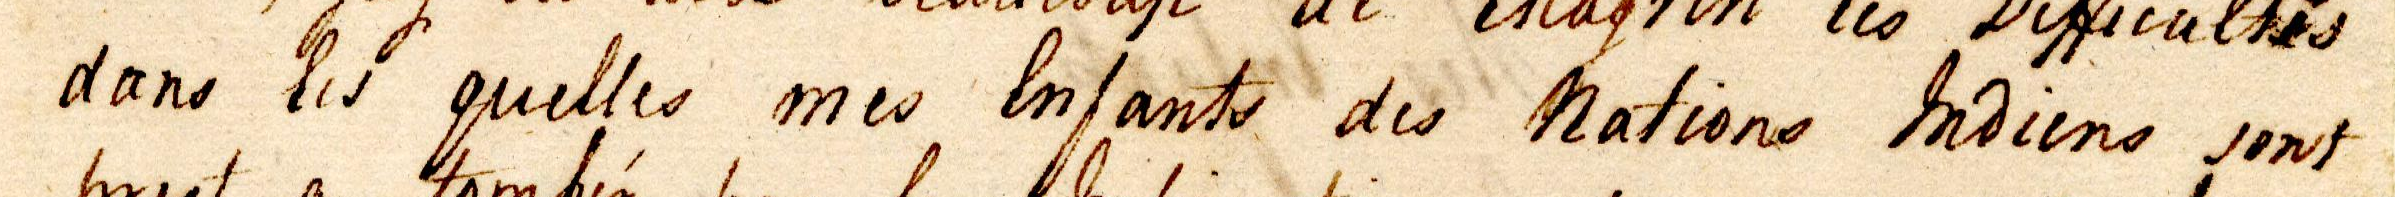dans les quelles mes Enfants des Nations Indiens sont
